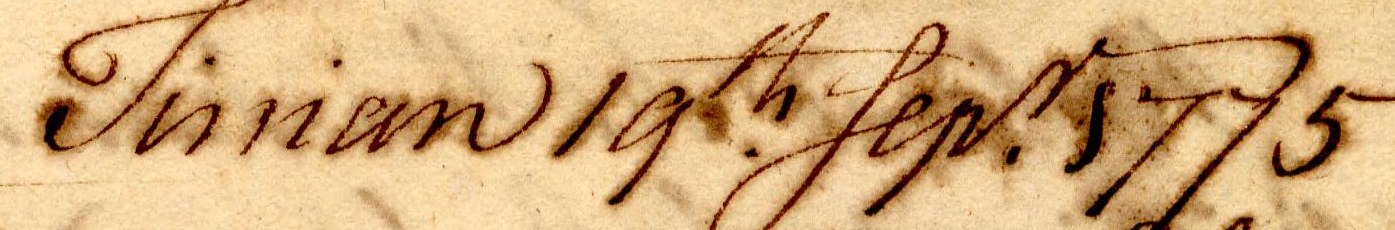Tinian 19^th. Sep^r. 1775
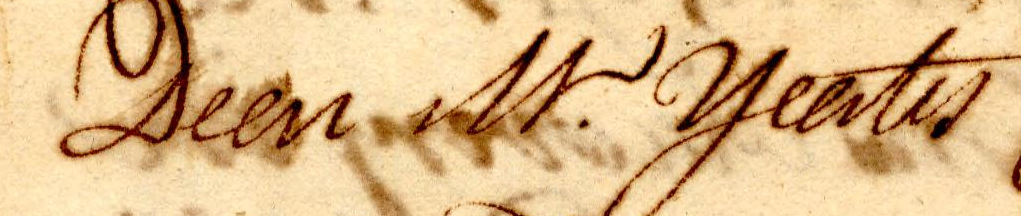Dear M^r. Yeates
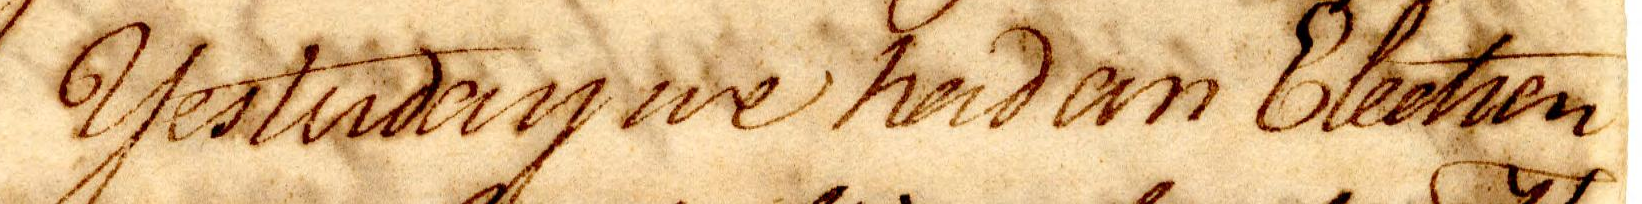Yesterday we had an Election
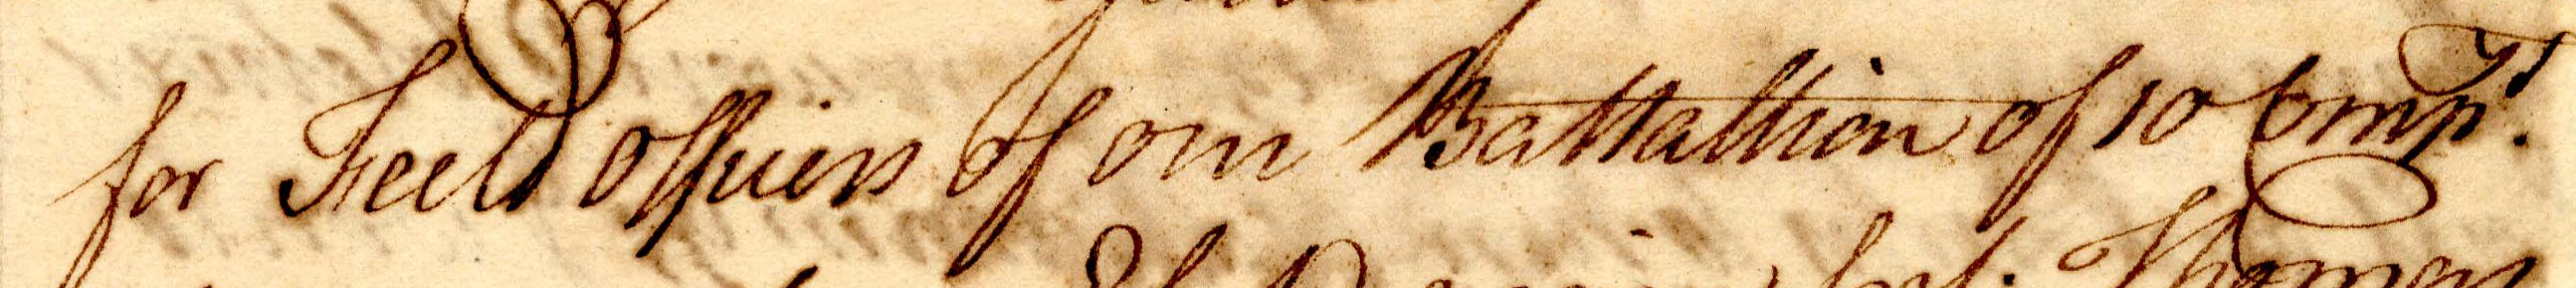for Field Officers of our Battalion of 10 Comp^y.
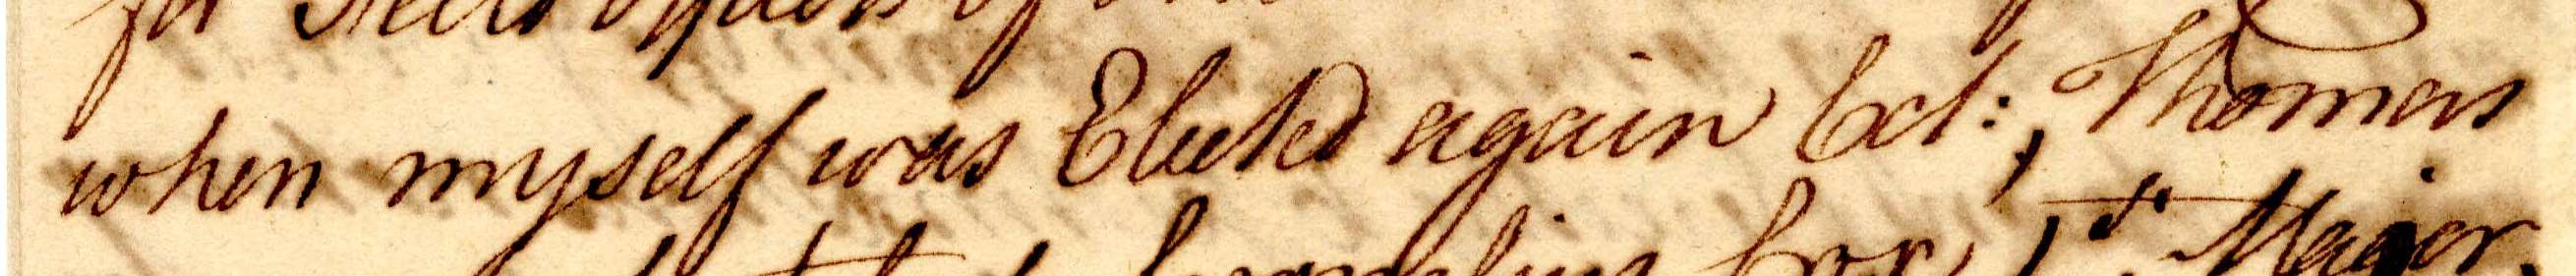when myself was Elected again Col: Thomas
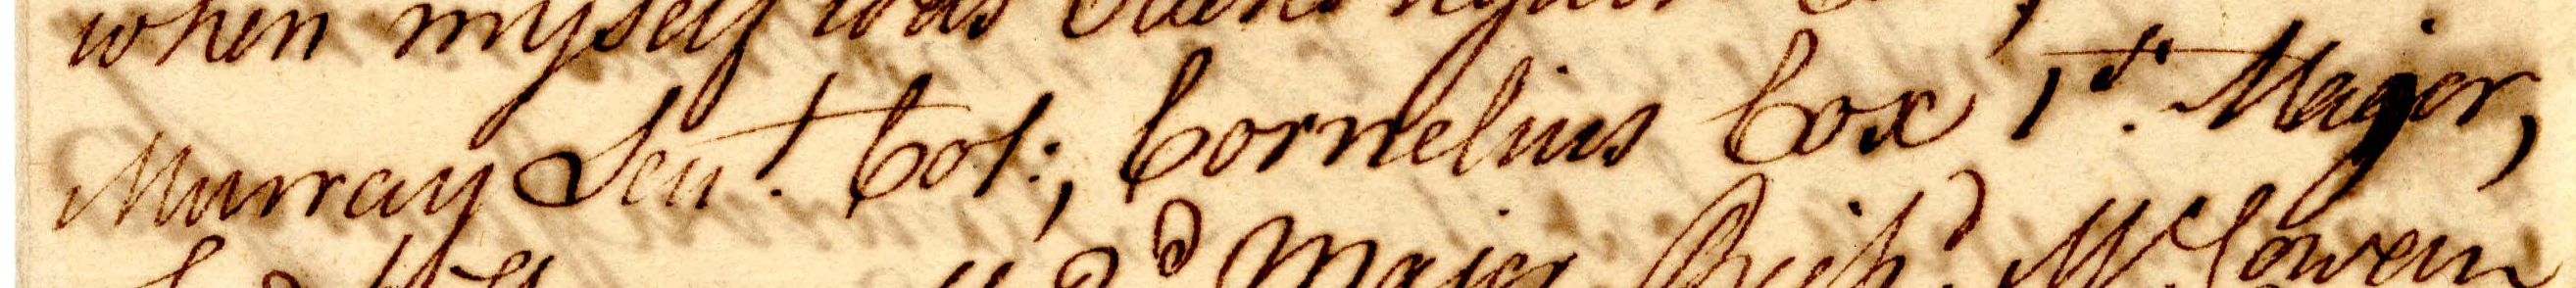Murray Leu^t. Col: Cornelius Cox 1^st Major,
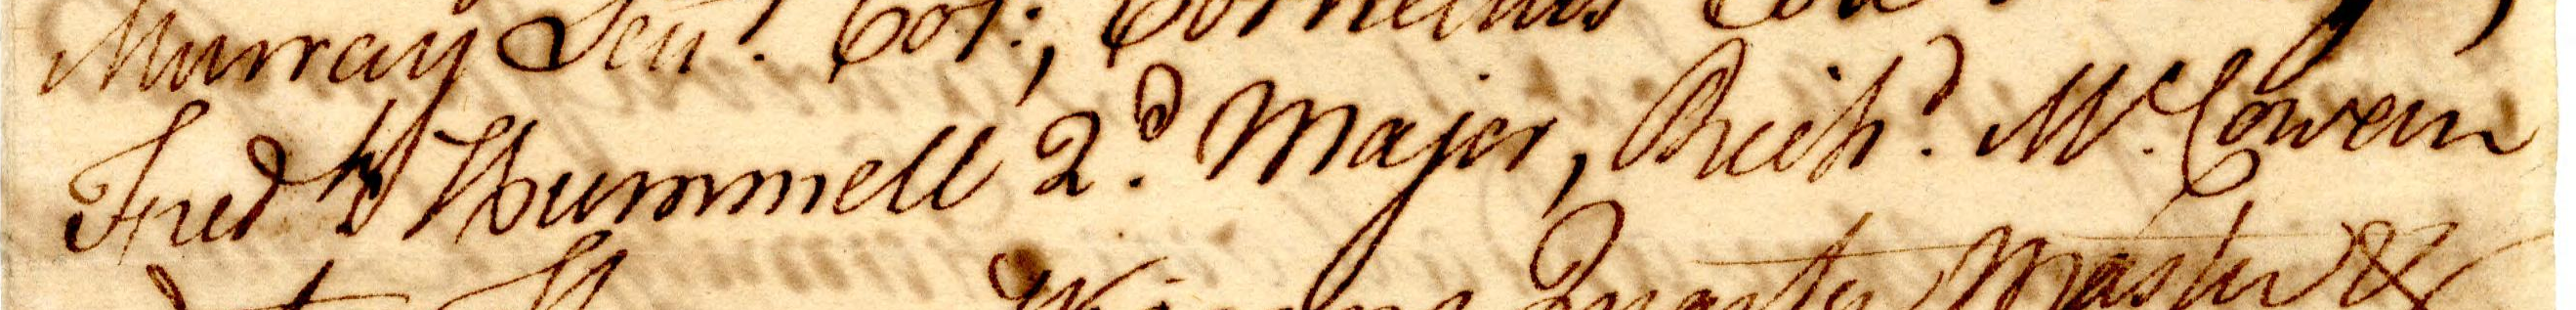Fred^k Hummell 2^d. Major, Rich^d. M^cCowein
